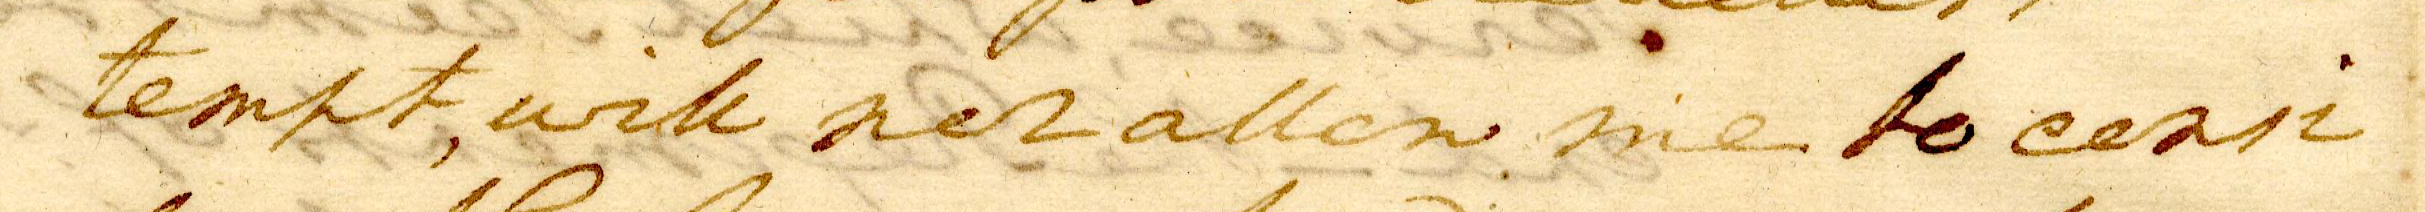-tempt, will not allow me to consi
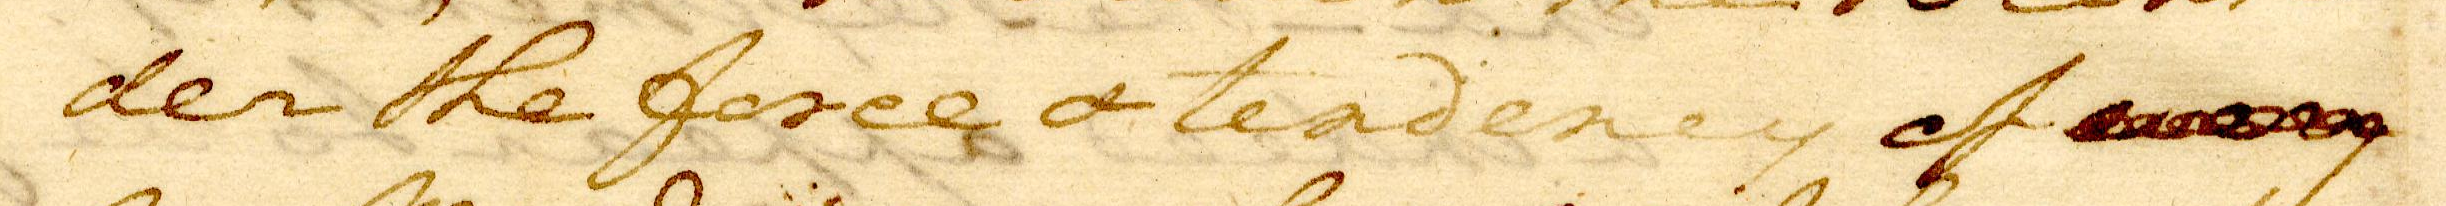der the force & tendency of [_____]
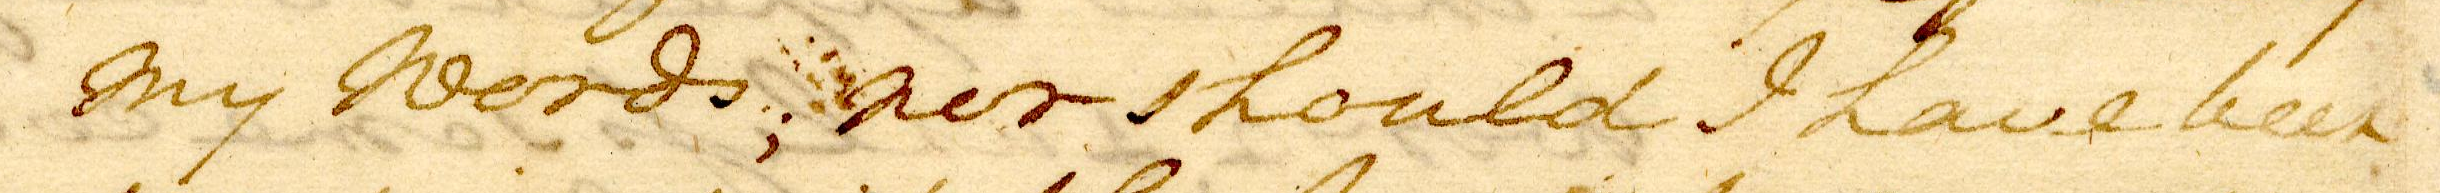my Words; nor should I have been
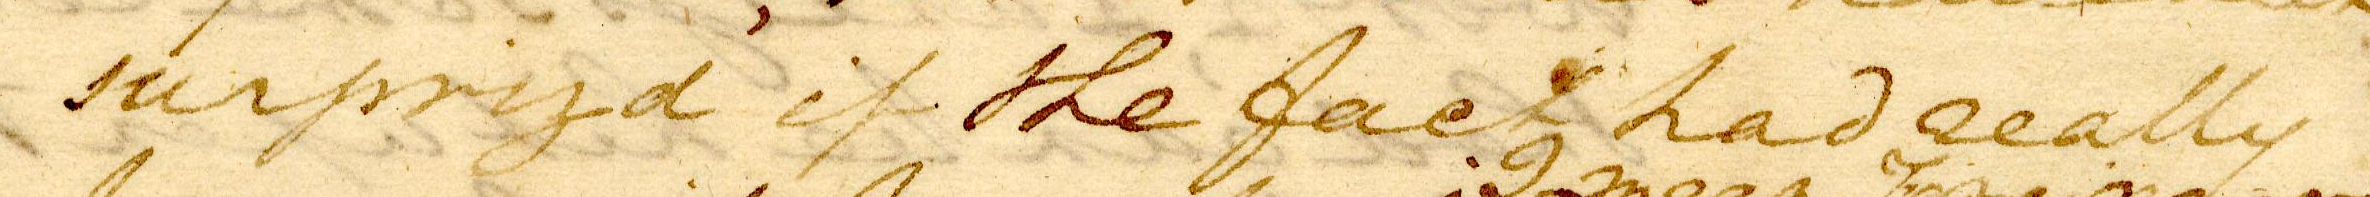surprizd it the fact had really
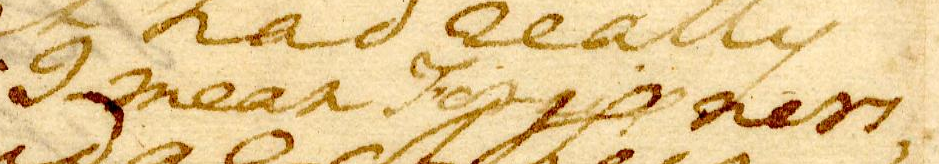I mean Foreigners
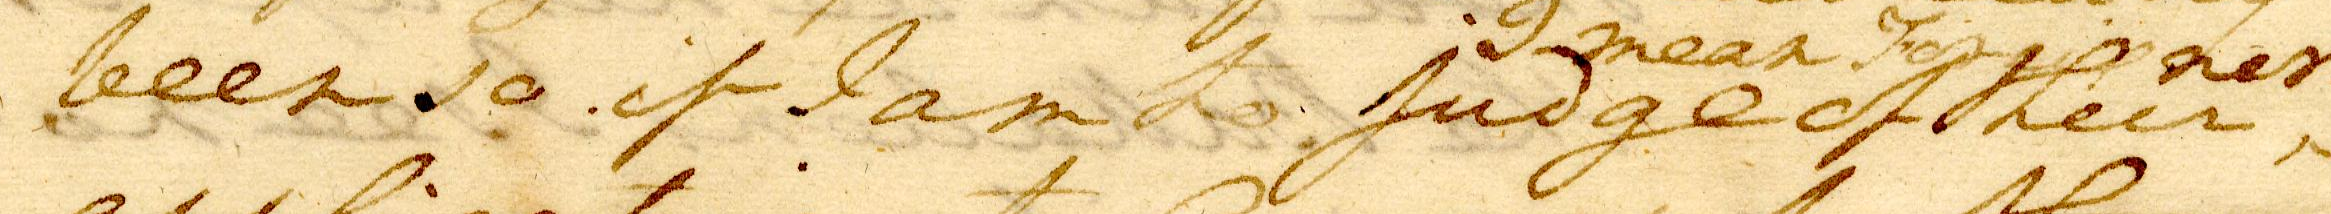been so if I am to judge of their
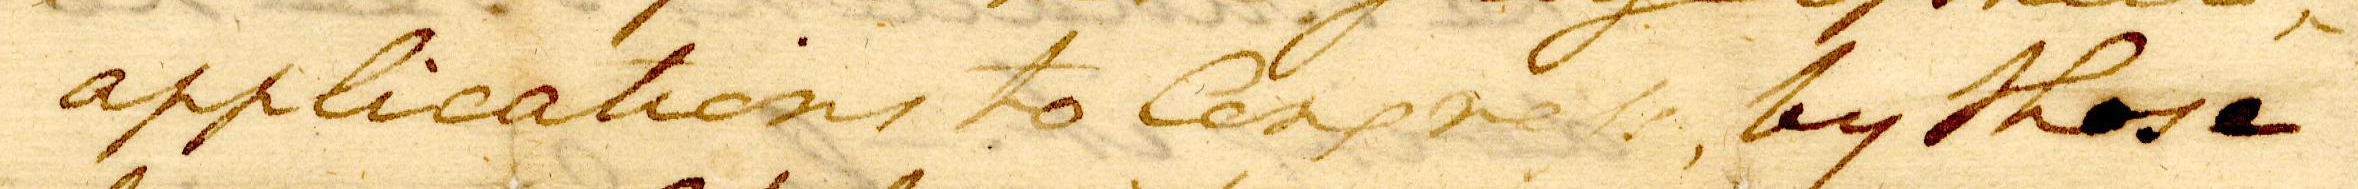applications to Congress, by those
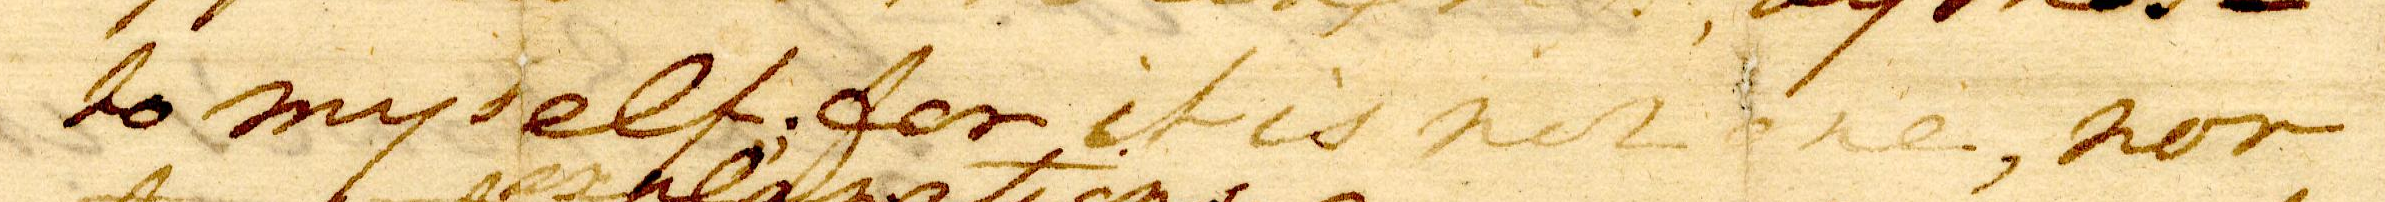to myself, for it is not one, nor
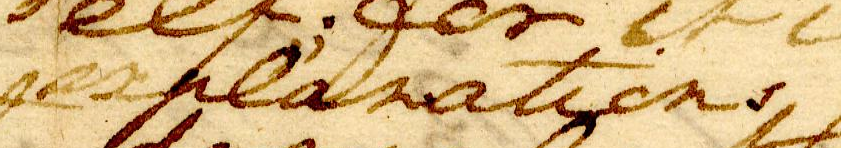explanations
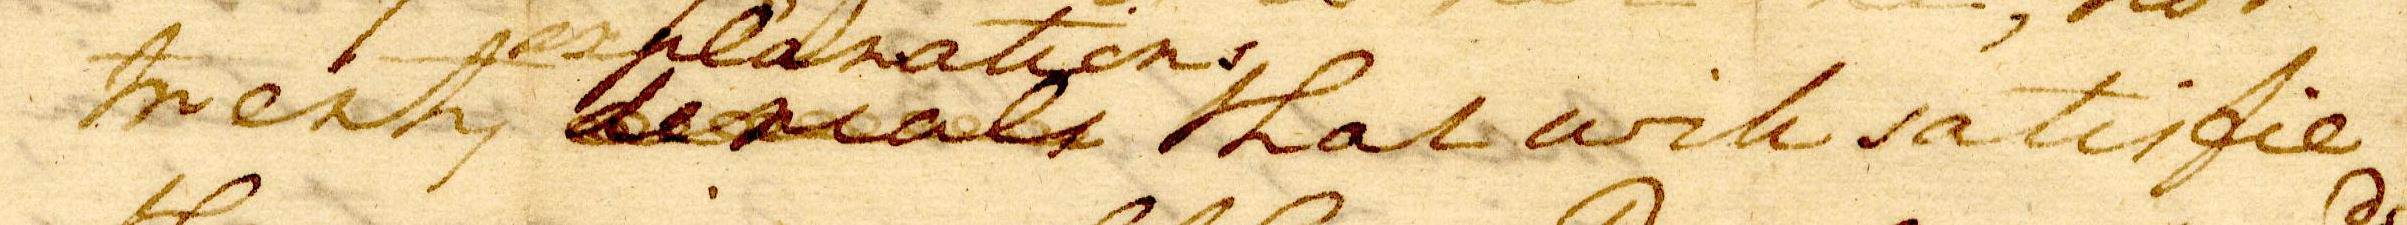twenty [_____] that with satisfie
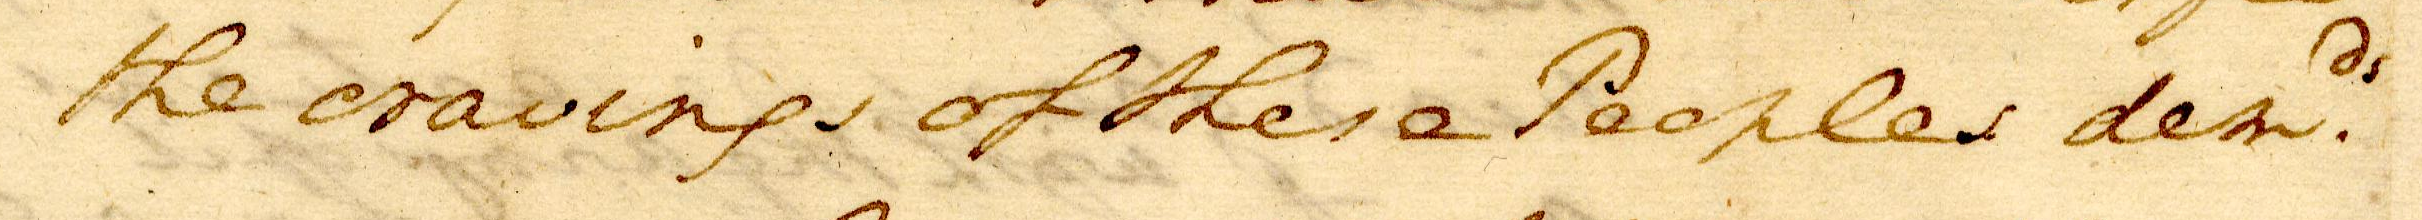the cravings of these Peoples dem^ds.
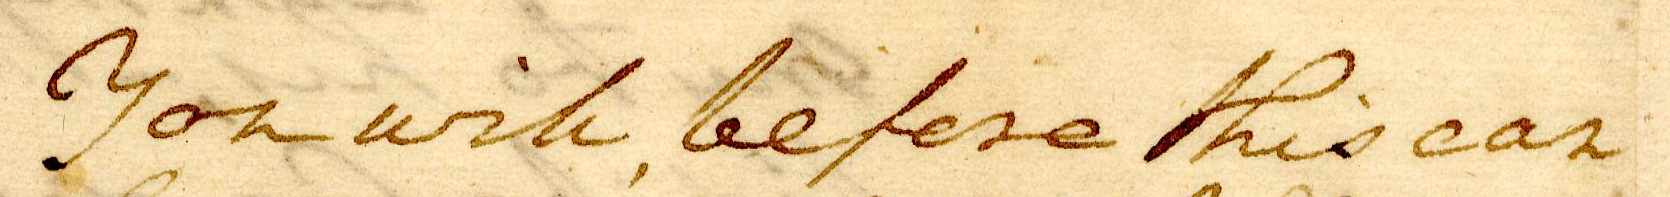You will before this can
